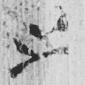之
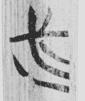必
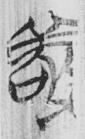敬
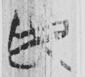女（如）
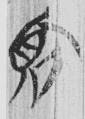○（賓）
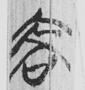客
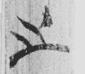之
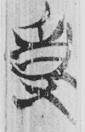事
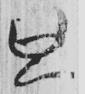也
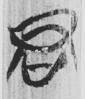君
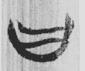曰
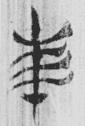○（薦）
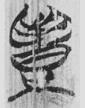豊（禮）
